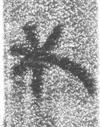木
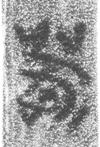器
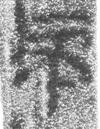杯
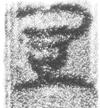豆
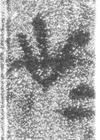三十
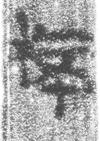杯
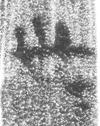三十
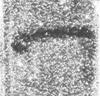一
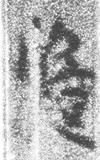○（橛）
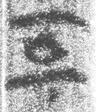五
